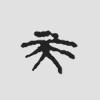天
